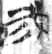戌
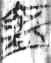寍（寧）
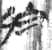於
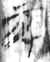亥
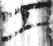工（空）
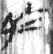於
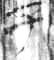子
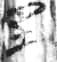坐
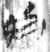於
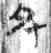丑
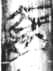盍（蓋）
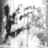於
